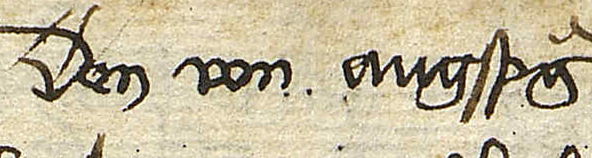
Den von augſp*g
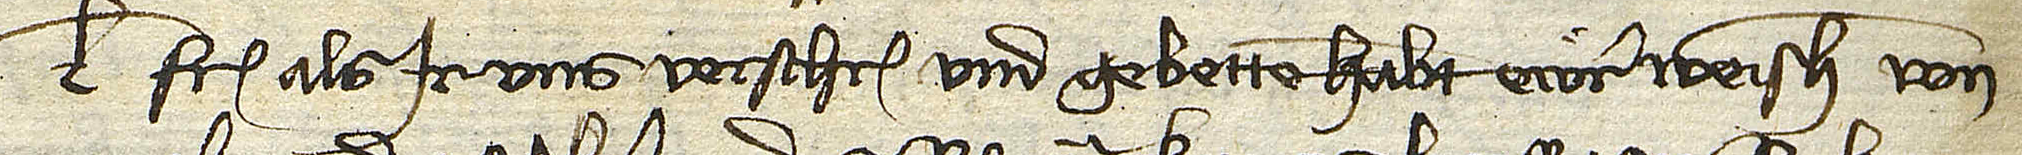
L* fr* als Ir vns verſchr* vnd gebette* habt ew*r weiſh* von
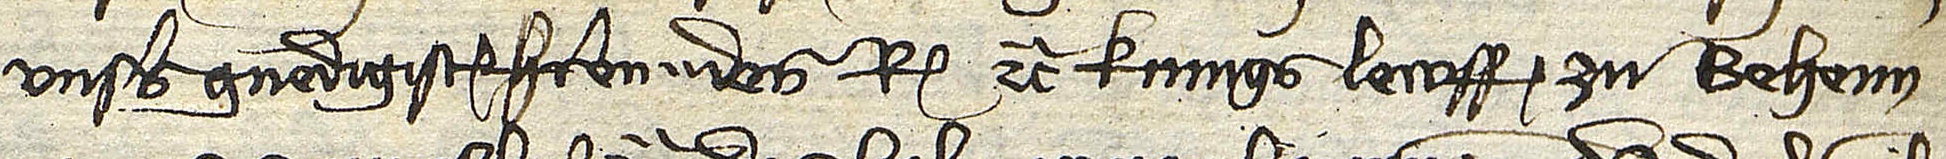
vnſ*s gnedigiſt* h*ren ~ des R* ec* kunigs lewff* ʒu Beheim
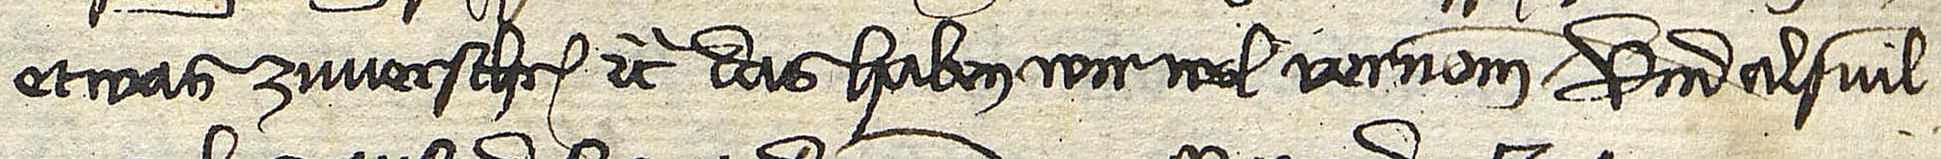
etwas ʒuuerſchr* ec* das haben wir wol vernom* / Vnd alſuil
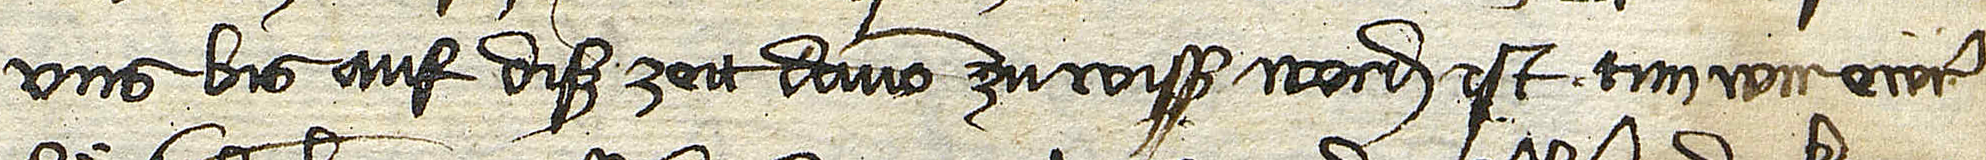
vns bis auf diſʒ ʒeit dauo* ʒu wiſſ* word* iſt . tun wir ew*r
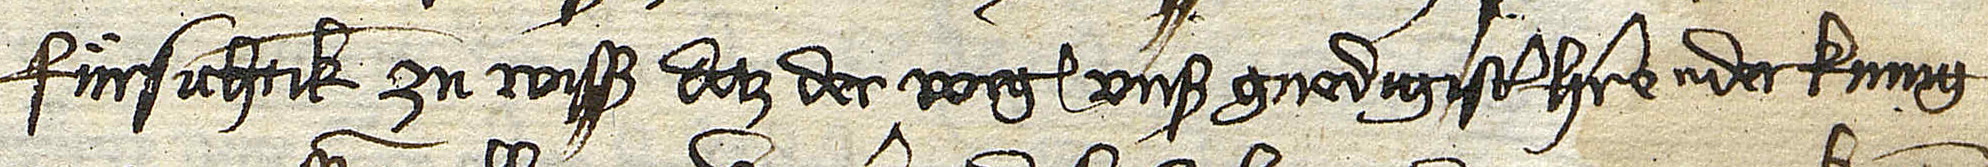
fürſichtik* ʒu wiſſ* daʒ der vorg* vnſ* gnedigiſt* h*re ~ der kunig
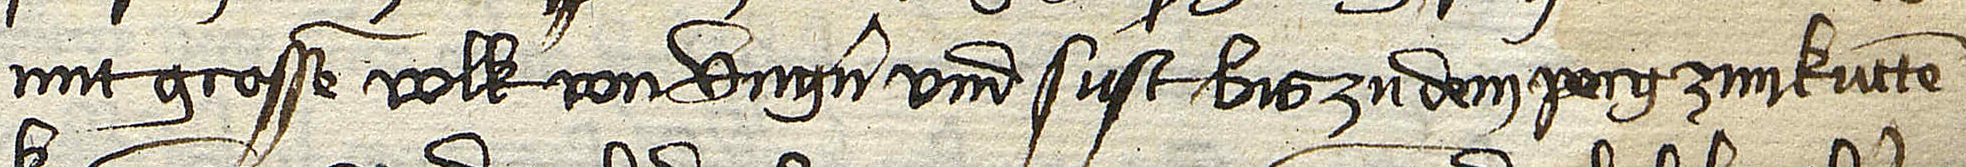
mit groſſe* volk von Vng*n vnd ſuſt bis ʒu dem perg ʒum kutte*
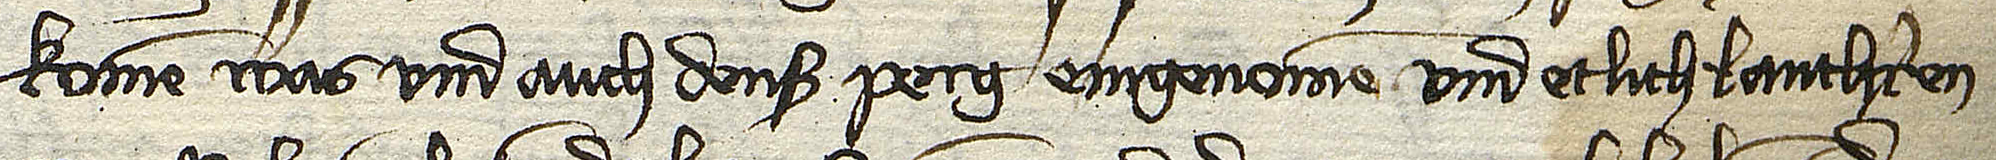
kome* was vnd auch denſ* perg eingenome* vnd etlich lanth*ren
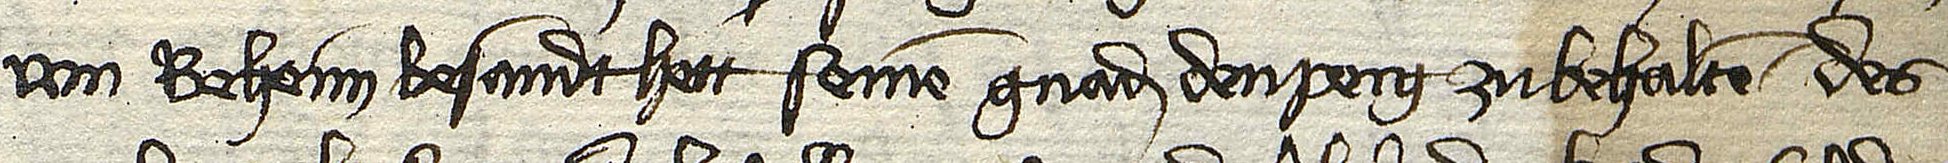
von Beheim beſandt hett ſeine* gnad* den perg ʒu behalte* / des
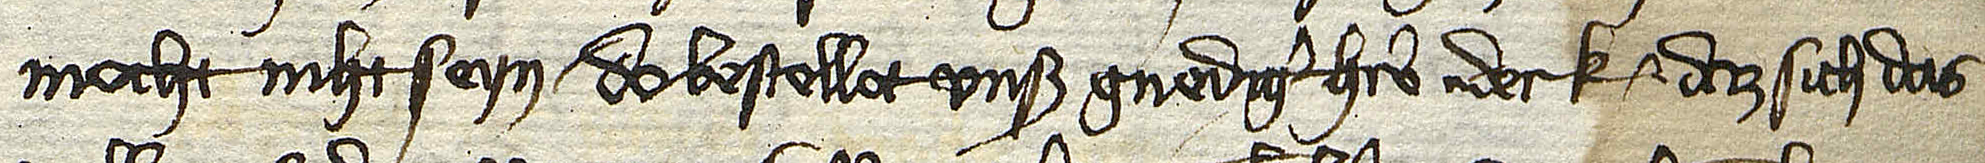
mocht niht ſeyn / do beſtellot vnſ* gnedig* h*re ~ der k* . daʒ ſich das
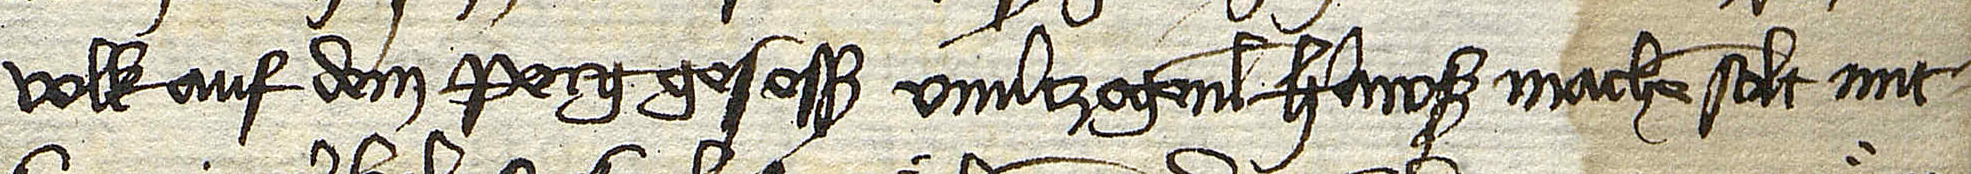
volk auf dem Perg geſeſſ* vnu*cʒogenl* h*awſʒ mache* ſolt mit =
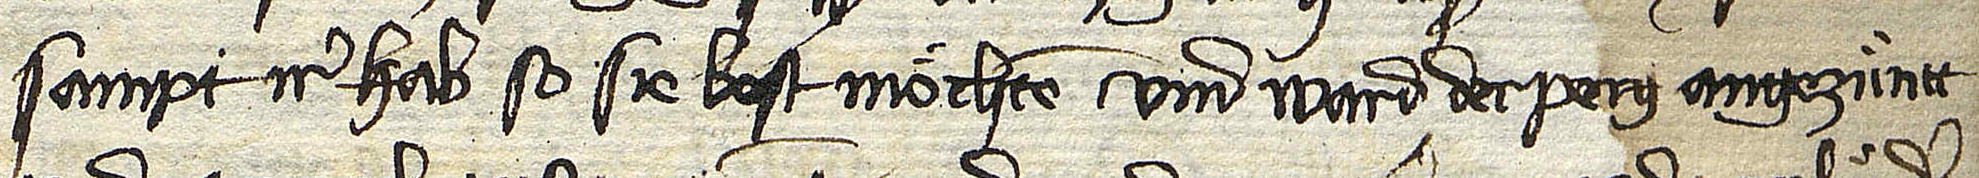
ſampt ir* hab ſo ſie beſt möchte* vnd ward der perg angeʒüntt
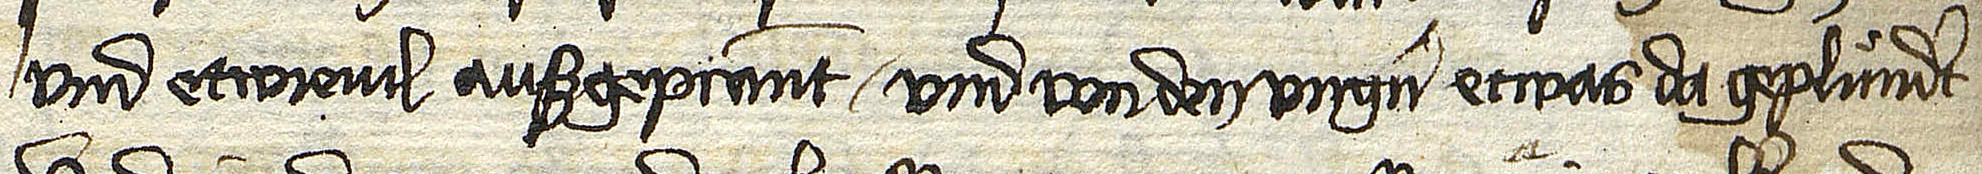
vnd etwieuil auſʒgepran*t / vnd von den vng*n etwas da geplünd*t
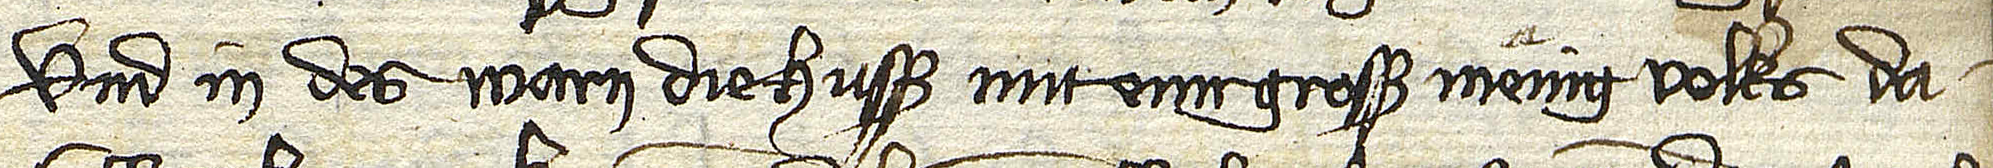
Vnd in des warn die huſſ* mit einr groſſ* mënig volks da -
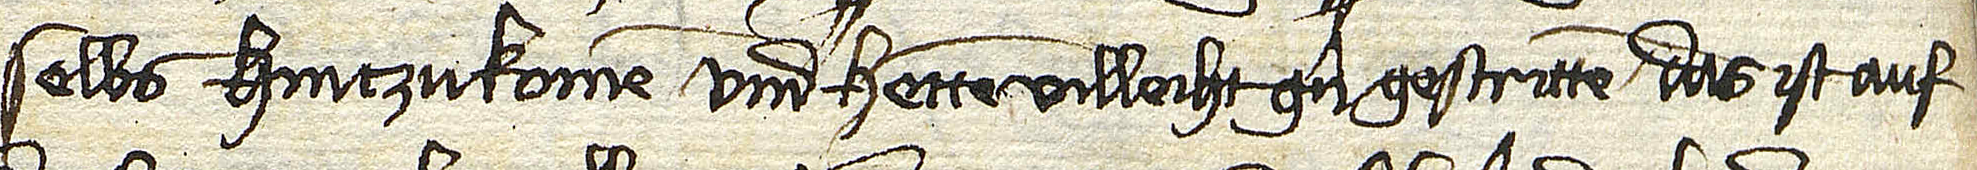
ſelbs hincʒukome* vnd hette* villeiht g*n geſtritte* / das iſt auf
